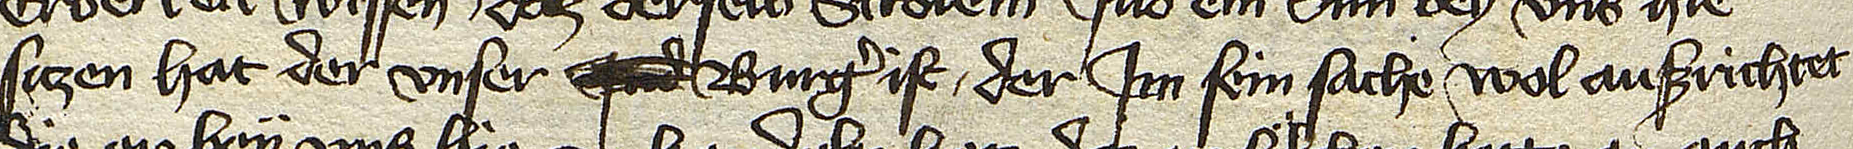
ſicʒen hat der vnſer Iud Burg* iſt / der Im ſein ſache wol aufʒrichtet
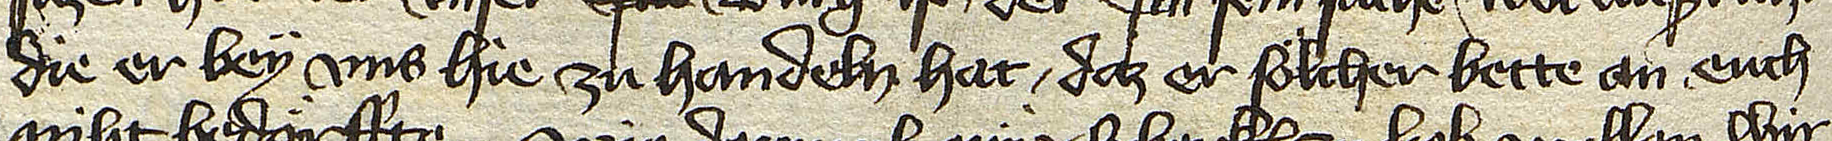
die er bey vns hie ʒu handeln hat / daʒ er ſölicher bette an euch
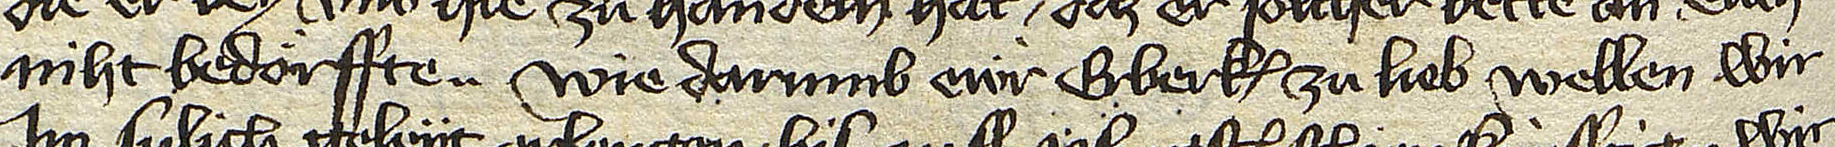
niht bedörffte . wie darumb eẅr Erberk* ʒu lieb wellen wir
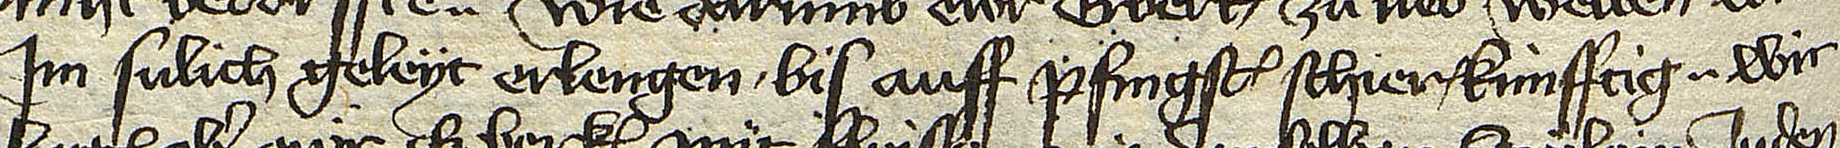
Im ſulich geleyt erlengen . biſ auff pfingſt* ſchier* künfftig ~ Wir
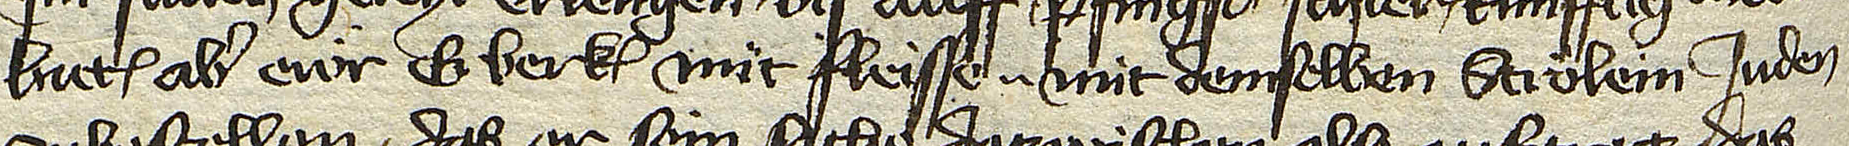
bitt* ab* eẅr Erberk* mit fleiſſe ~ mit demſelben Strölein Iuden
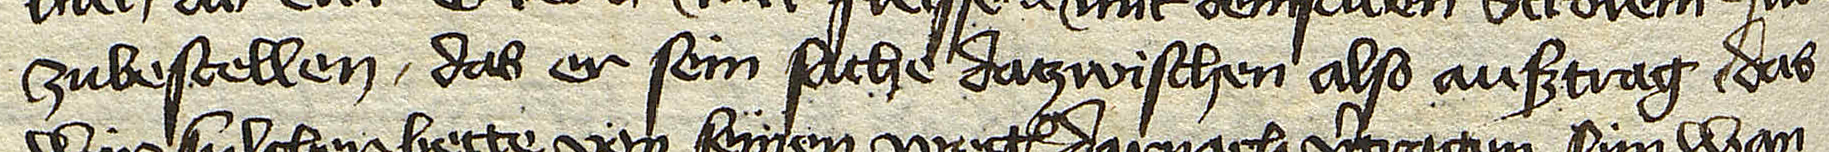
ʒubeſtellen / das er ſein ſache dacʒwiſchen alſo auſʒtrag / das
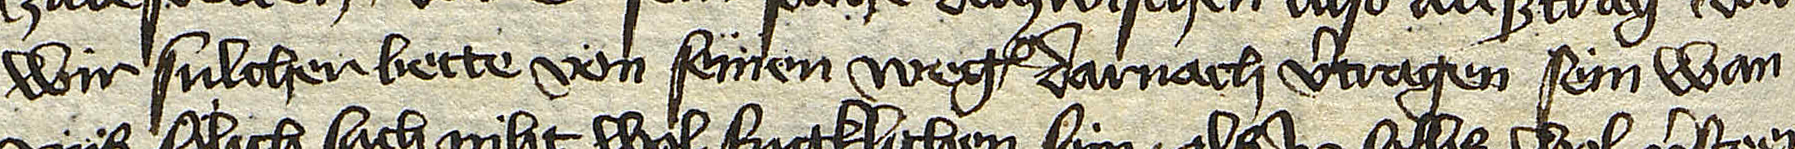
wir ſulchen bette von ſeinen weg* darnach v*tragen ſein wan
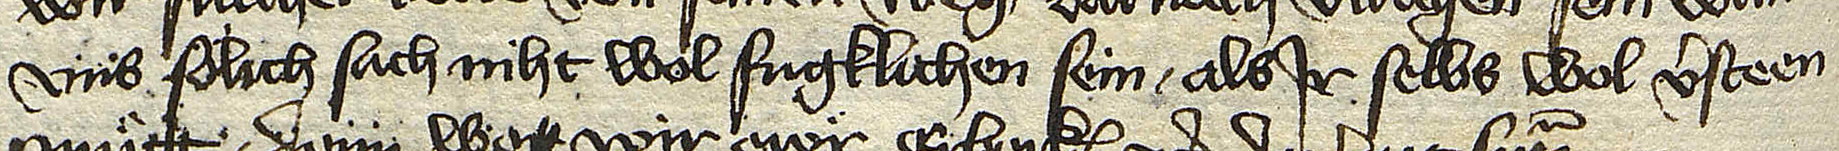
vns ſölich ſich niht wol fugklichen ſein / als Ir ſelbs wol v*ſteen
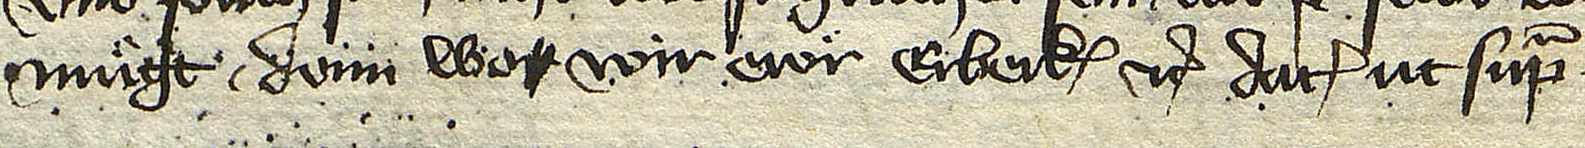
mügt / denn wor wir eẅr Erberk* ec* dat* ut ſup*
